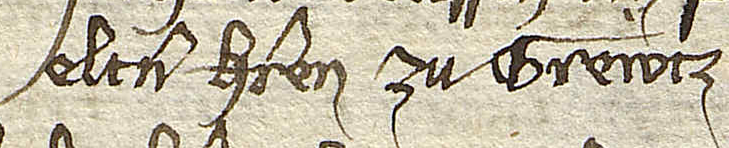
eltn* h*ren ʒu Greẅcʒ
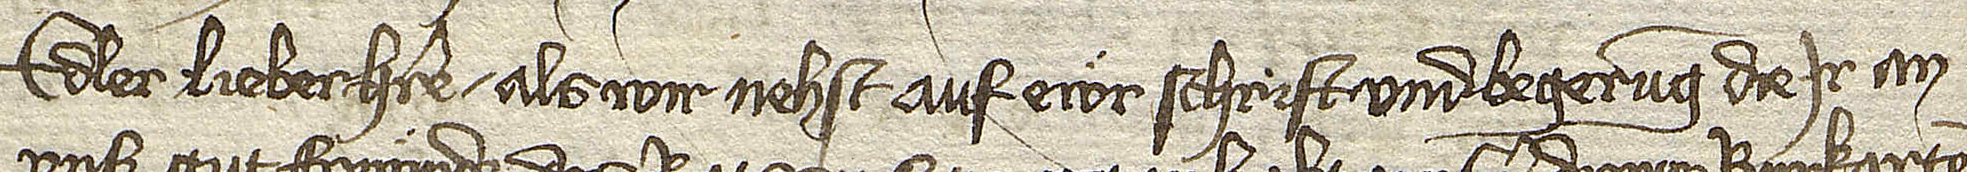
Edler lieber h*re / als wir nehſt auf eẅr ſchrift vnd begeru*g die Ir an
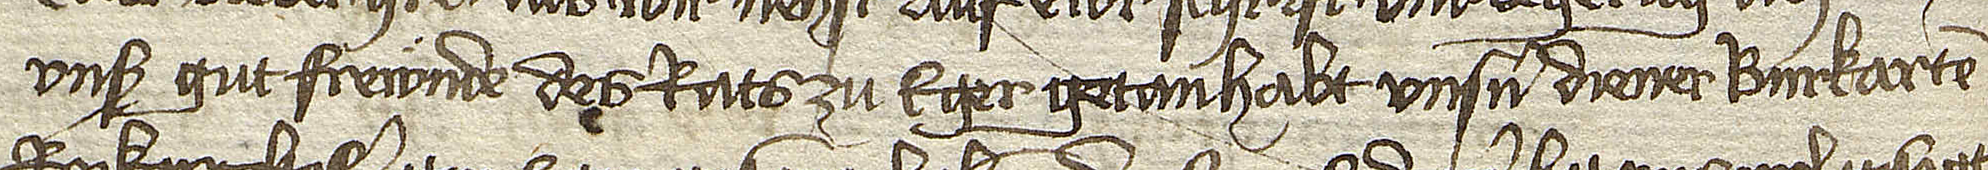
vnſ* gut freẅnde des Rats ʒu Eger getan habt vnſn* diener Burkarte*
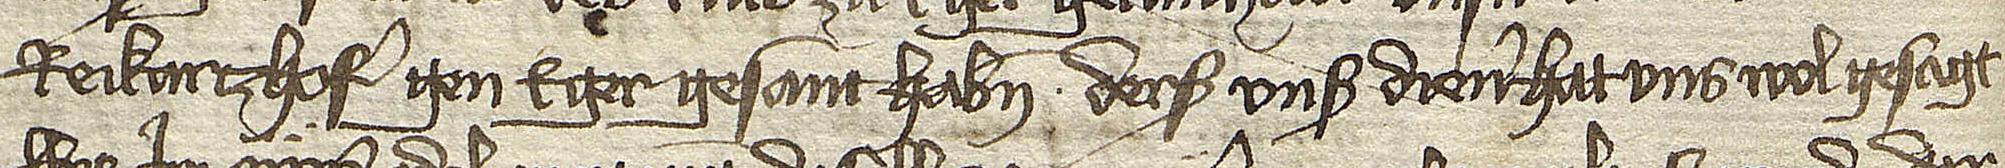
Reikarcʒhof* gen Eger geſant habn* . derſ* vnſ* dien* hat vns wol geſagt
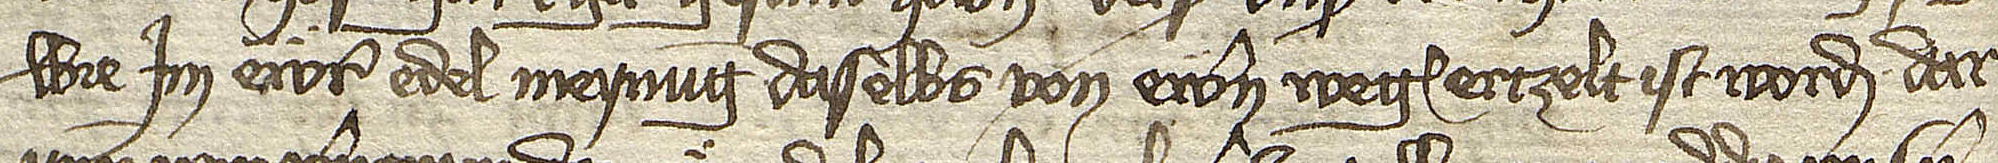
wie Im eẅr* edel meynu*g daſelbs von eẅ*n weg* ercʒelt iſt word* . dar
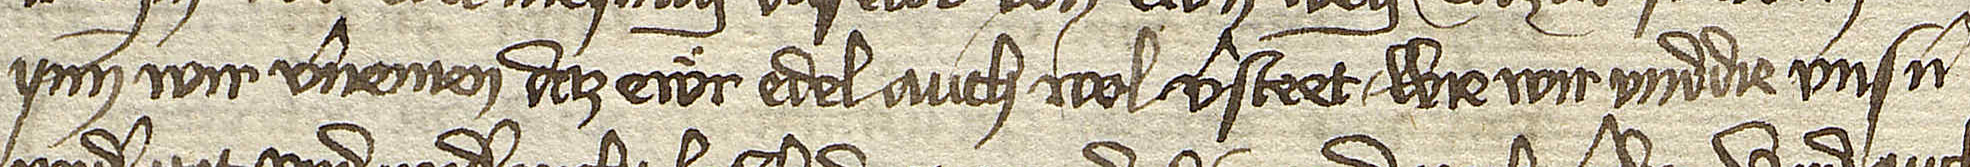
ynn* wir v*nemen daʒ eẅr edel auch wol v*ſteet / wie wir vnd die vnſn*
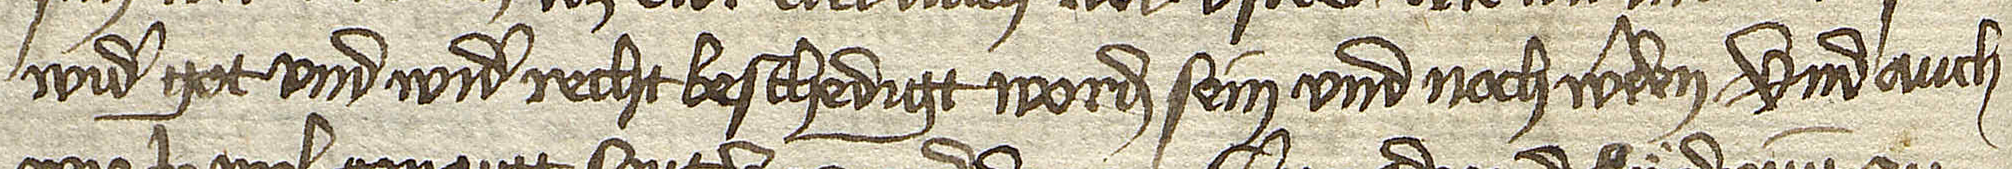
wid* got vnd wid* recht beſchedigt word* ſein vnd noch w*den / Vnd auch
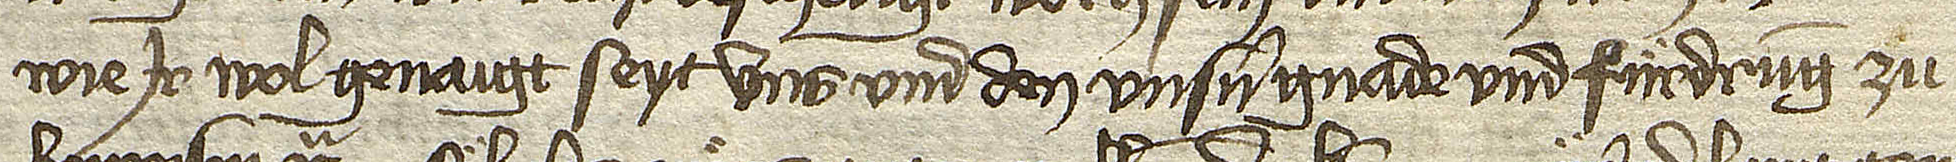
wie Ir wol genaigt ſeyt vns vnd den vnſn* gnade vnd fürdru*g ʒu
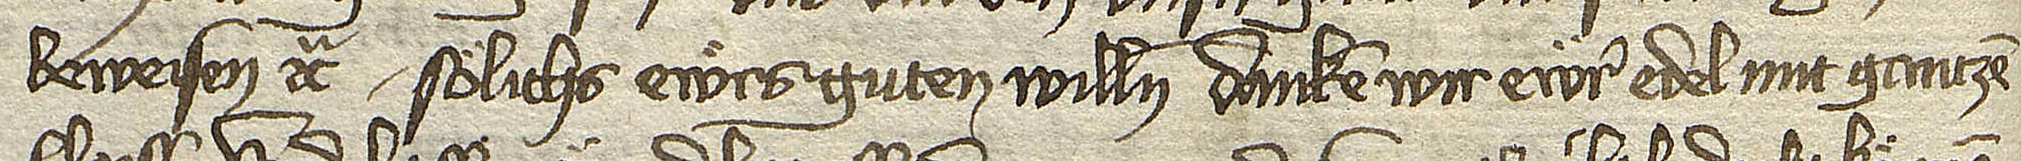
beweiſen ec* / ſölichs eẅrs guten willn* Danke* wir eẅr* edel mit gancʒe*
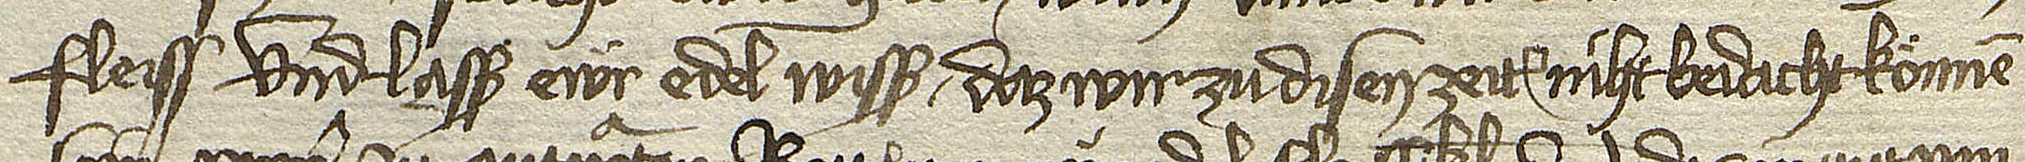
fleiſſ Vnd laſſ* eẅr edel wiſſ* / Daʒ wir ʒu diſen ʒeit* niht bedacht könne*
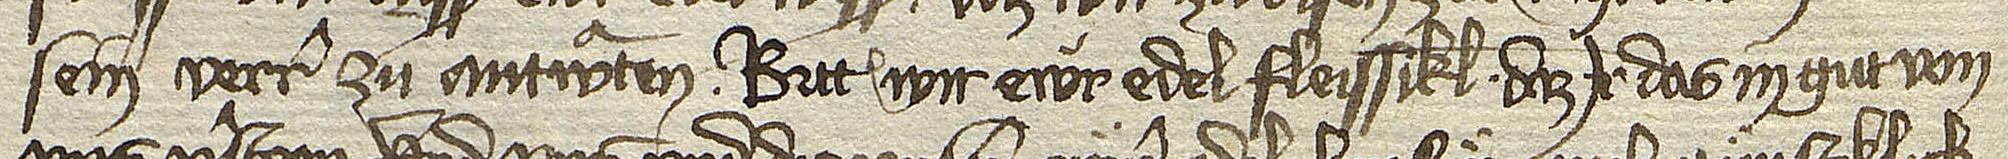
ſein verr* ʒu antw*ten . Bitt* wir eẅr edel fleiſſikl* . daʒ Ir das in gut von
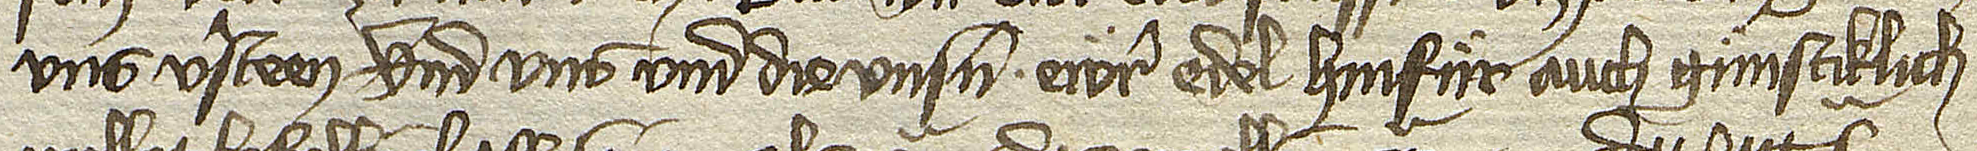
vns v*ſteen Vnd vns vnd die vnſn* eẅr* edel hinfür auch günſtiklich
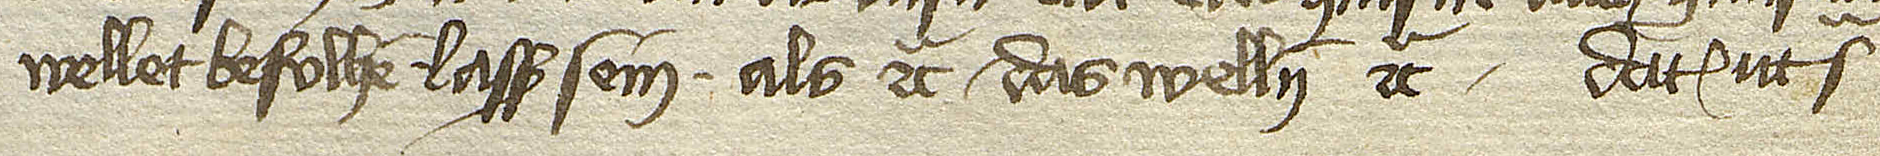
wellet befolhe* laſſ* ſein . als ec* / das welln* ec* / dat* ut ſ*
